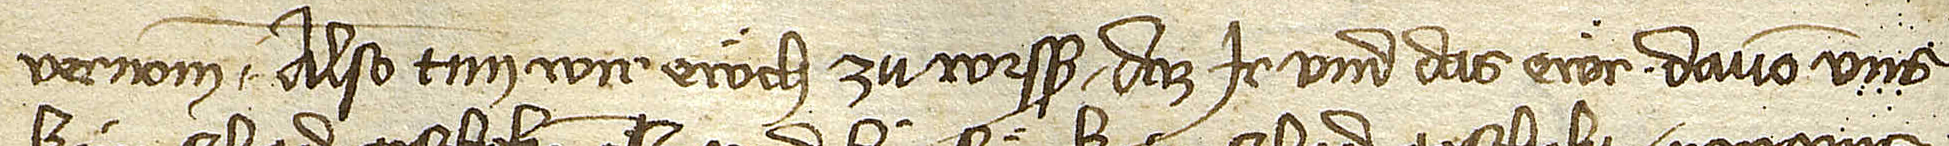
vernom* / Alſo tun wir ewch ʒu wiſſ* / daʒ Ir vnd das ewr . dauo* vns
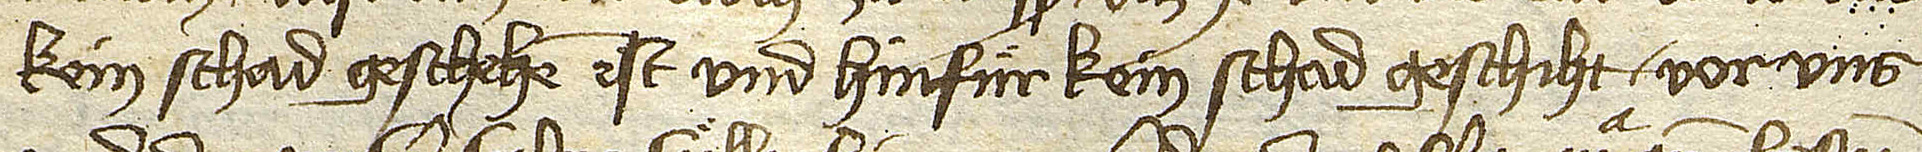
kein ſchad geſchehe* iſt vnd hinfür kein ſchad geſchiht / vor vns
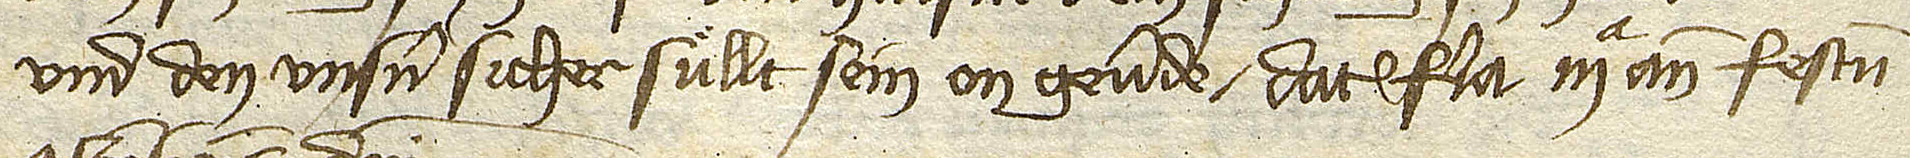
vnd den vnſ*n ſicher ſüllt ſein on geu*de / Dat* fia* iii* an* feſtu*
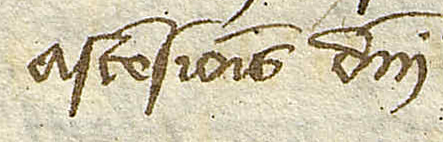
aſce*ſio*is dni*
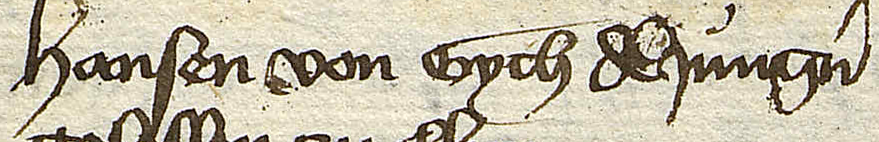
Hanſen von Gych de* Iüng*n
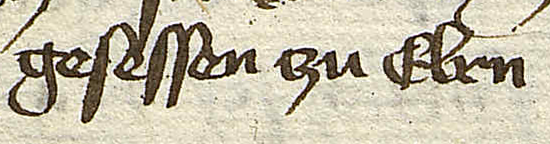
geſeſſen cʒu Elrn
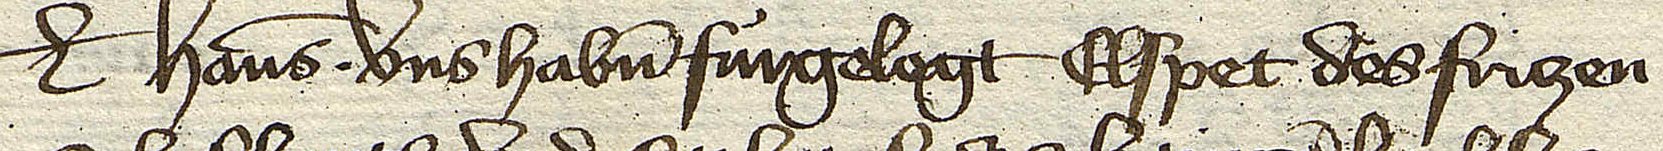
L* hans* . Vns hab*n fürgelegt Elſpet des fricʒen
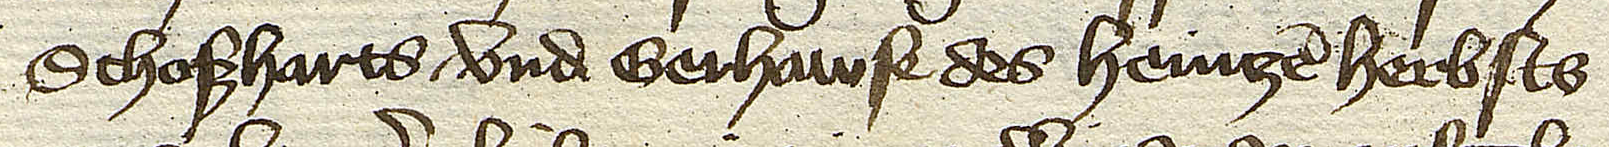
Schoſʒharts / Vnd Gerhawſe des heincʒe* herbſts
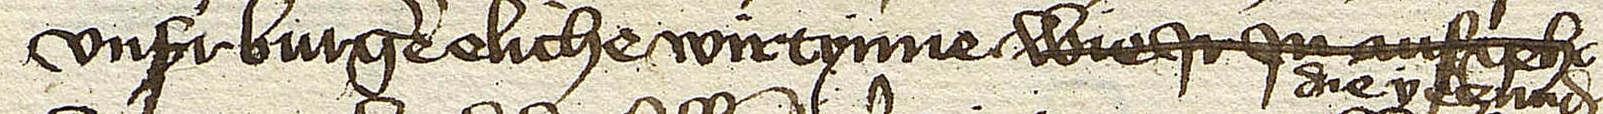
vnſ*r burge* eliche wirtynne / wie Ir In aufgeha
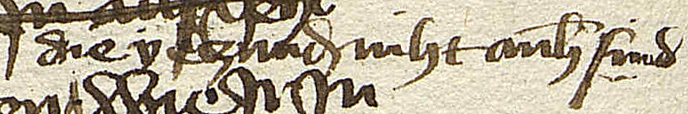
die yecʒund* niht anh* ſind
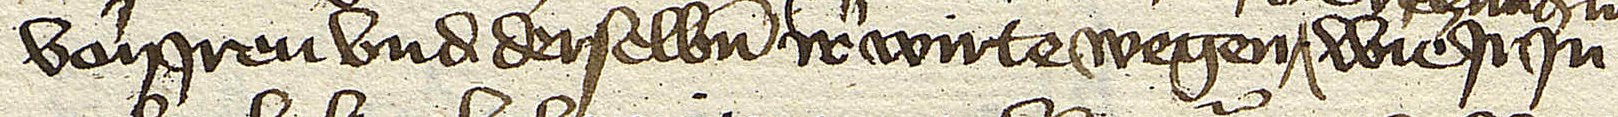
von Iren vnd derſelb*n ir* wirte wegen wie Ir In
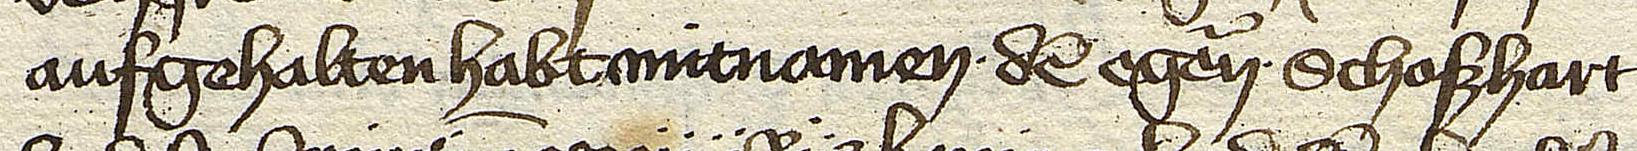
aufgehalten habt mitnamen . de* egen* . Schoſʒhart
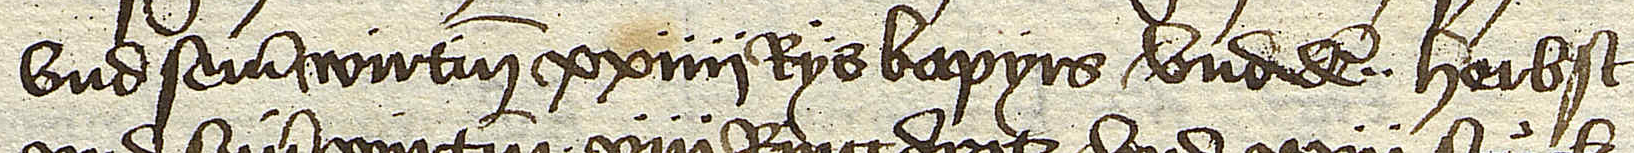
vnd ſein* wirtin* xxiiii Rycʒ bapyrs / vnd de* ~ herbſt
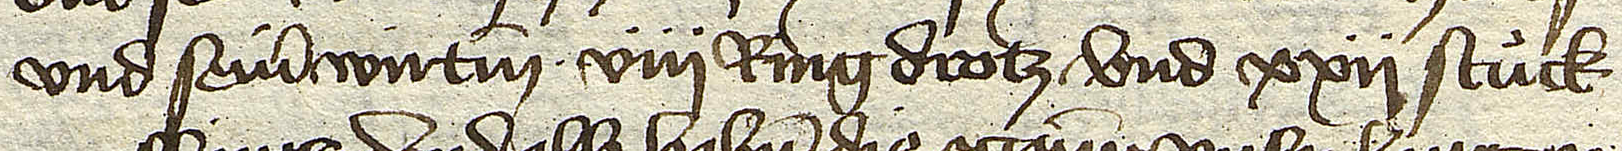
vnd ſein* wirtin* . viii Ring drocʒ / vnd xxii ſtück
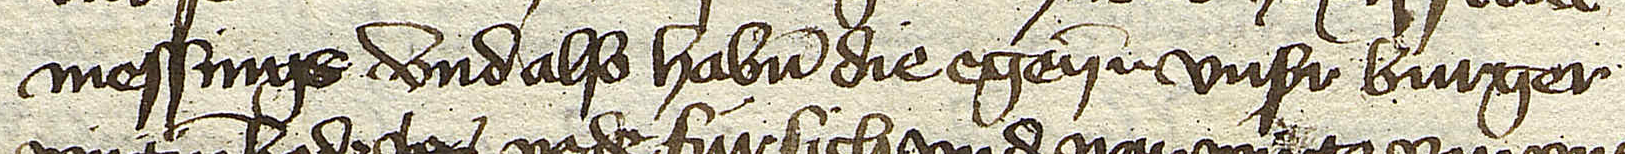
meſſings / vnd alſo hab*n die egen* ~ vnſ*r burger
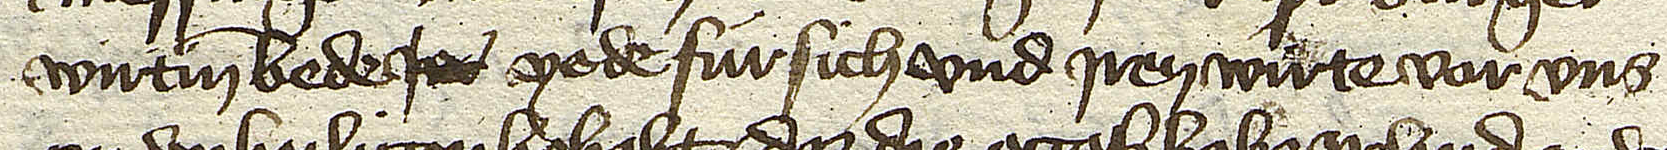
wirtin* bede Ir yede für ſich vnd Iren wirte vor vns
